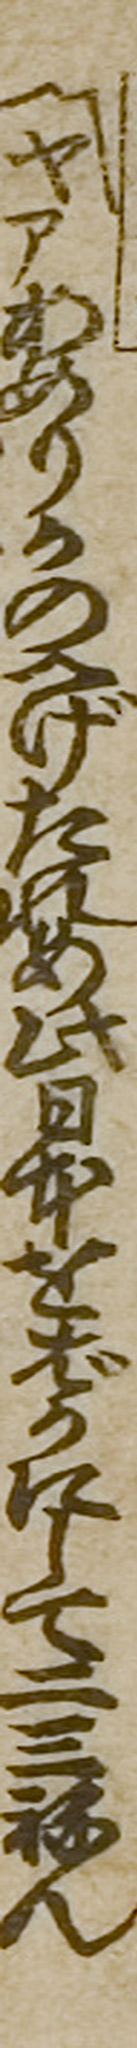ヤアあめりかのへげたれめ此日本をばかにして二三ねん
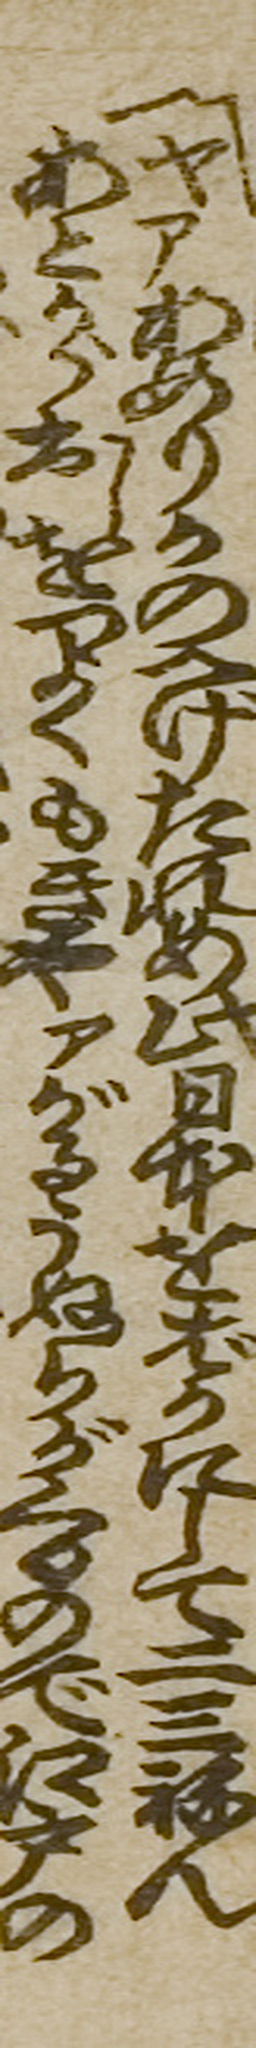あとからおしをつよくもきやアがるうぬらがくるので江戸の
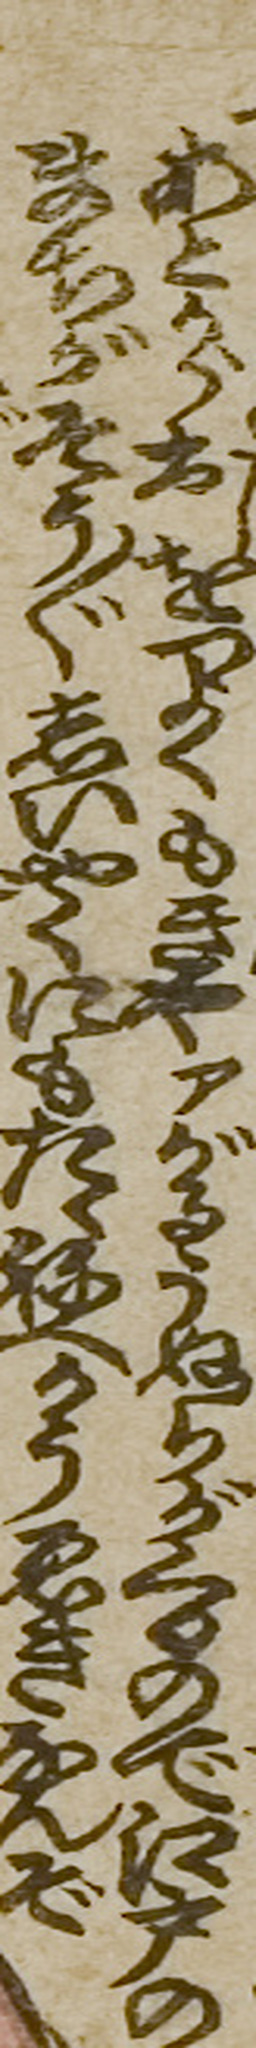まちがそうぞうしいやくにもたたねへかうゑきなんぞ
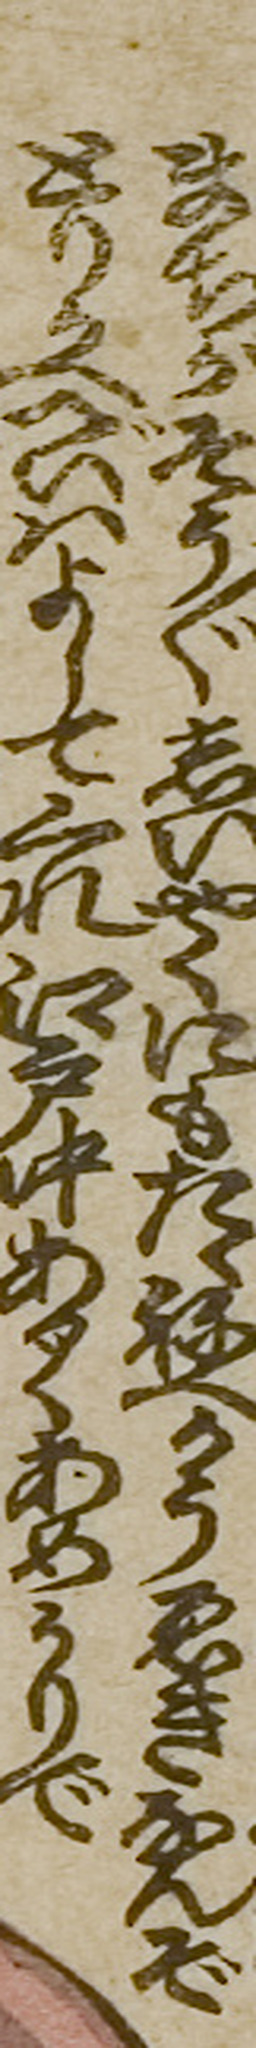とりかへべいハよしてくれ江戸中あるくあめうりで
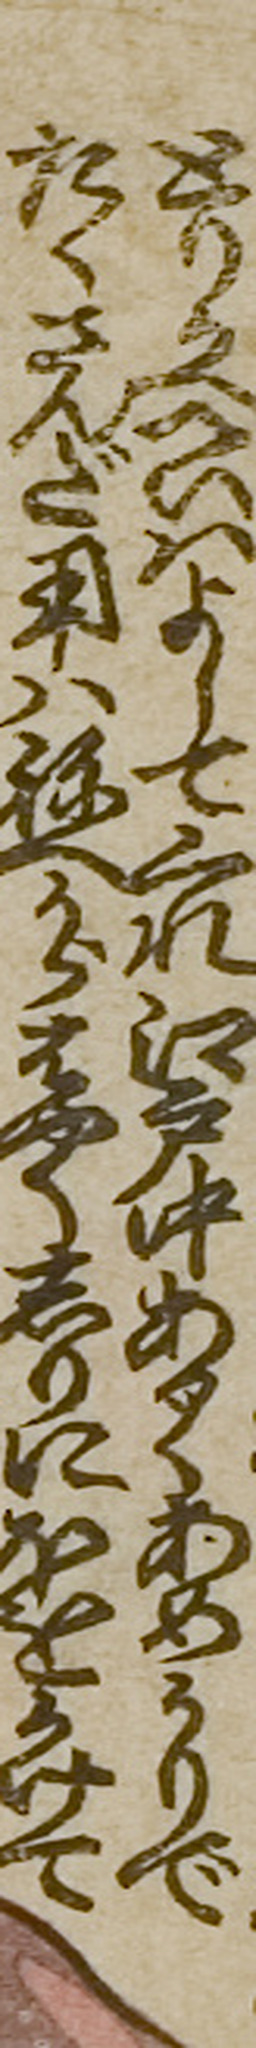たくさんだ用ハねへからはやくしりにほをかけて
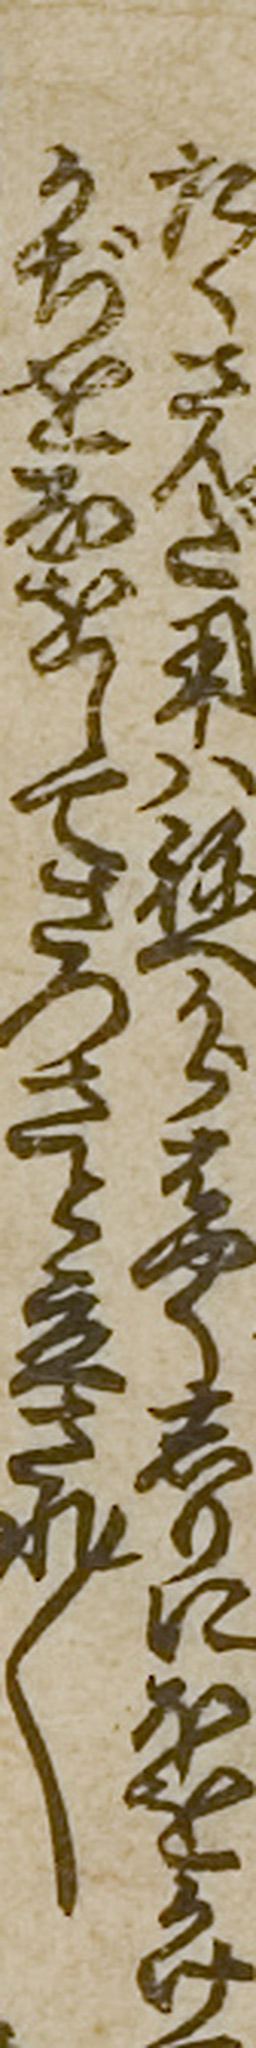かぢをなをしてさつさと立され立され
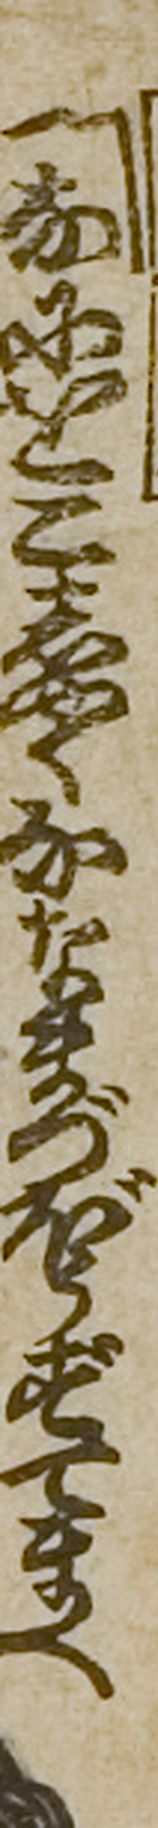なにをこしやくなまづぼうずてまへ
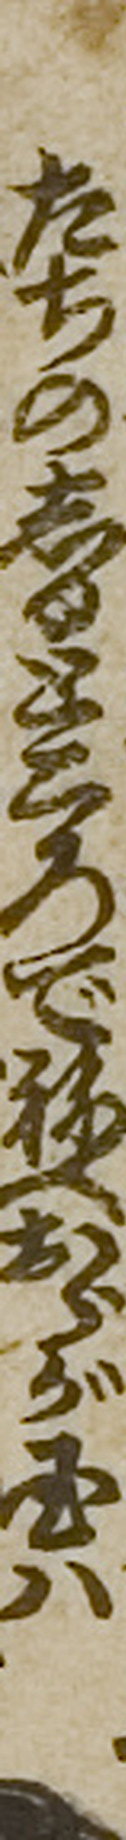たちのしるところでねへおらが国ハ
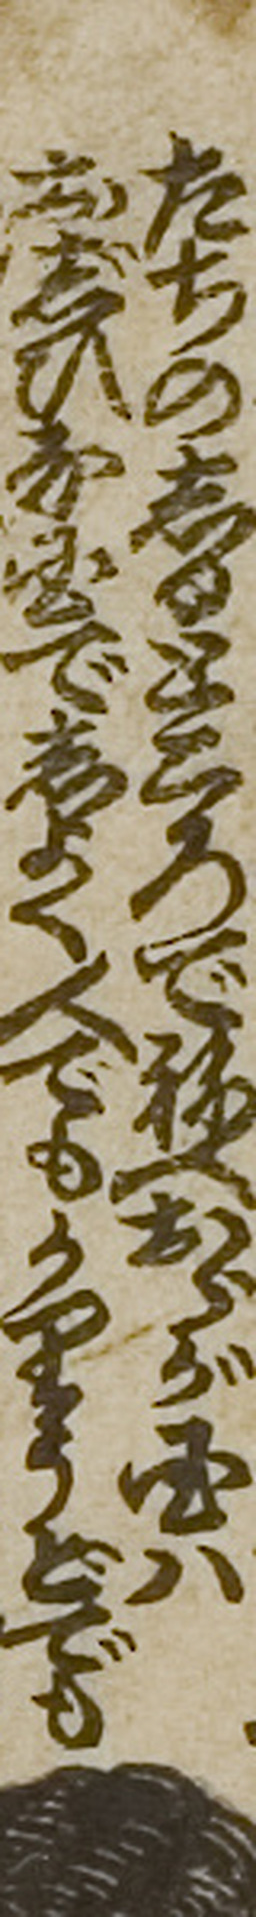おじひな国でしよく人でもかりうどでも
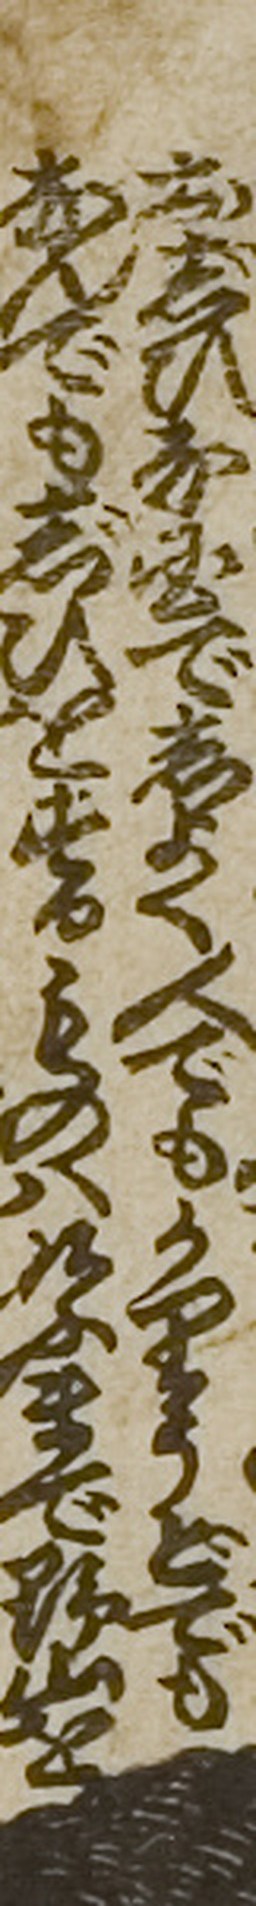なんでもじひをするものハけふまで野山を
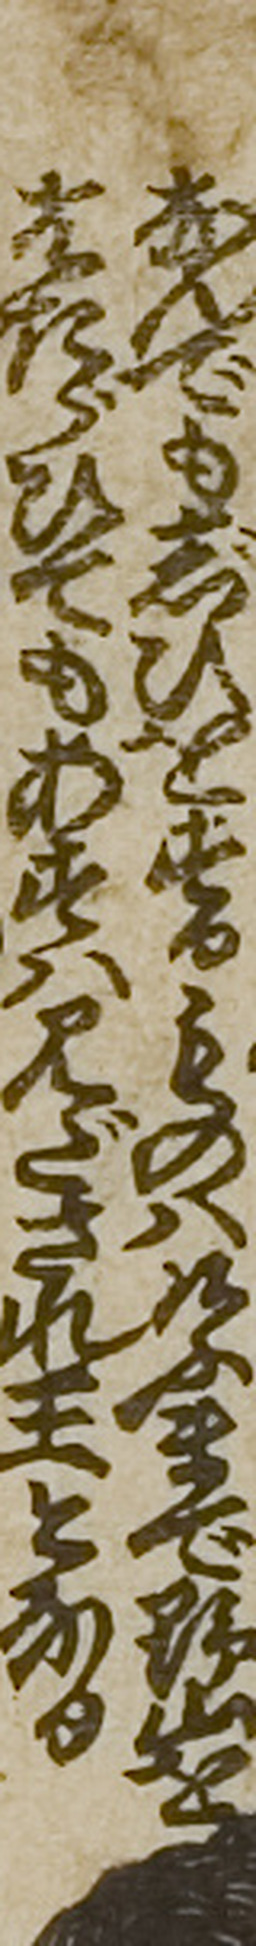はたらひてもあすハ見だされ王となる
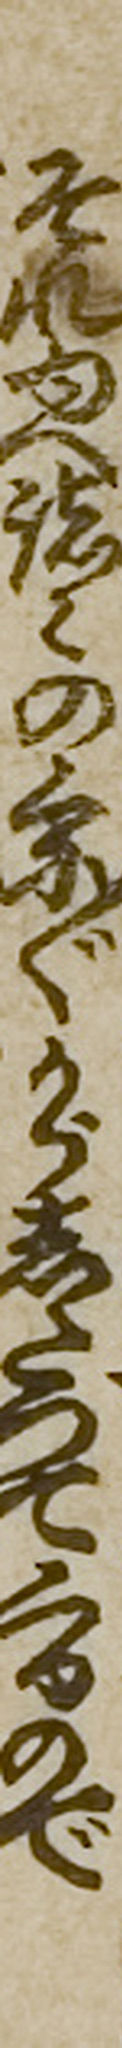それゆえ諸々のくに〴〵からしたつてくるので
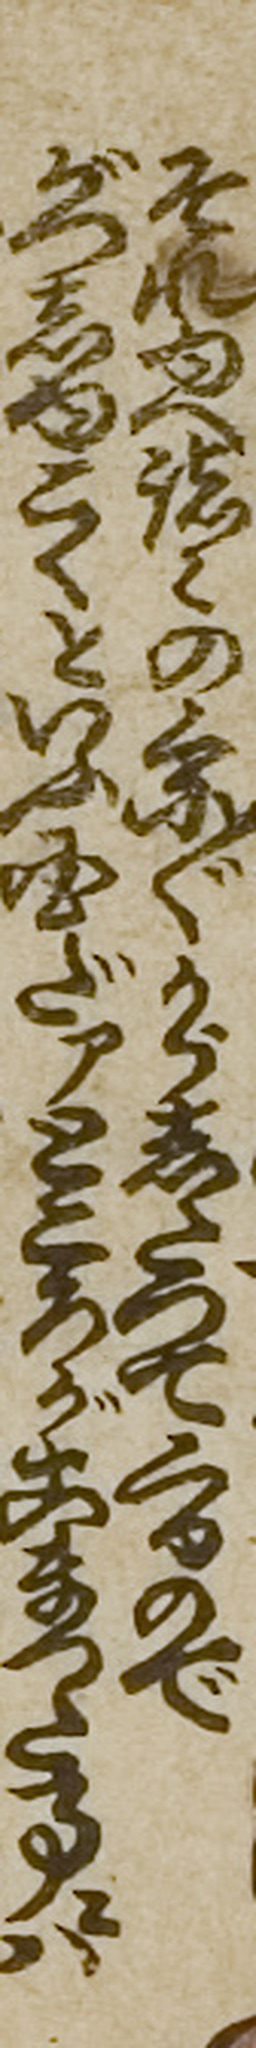がつしゆこくといふ国だアところがこまつた事ニハ
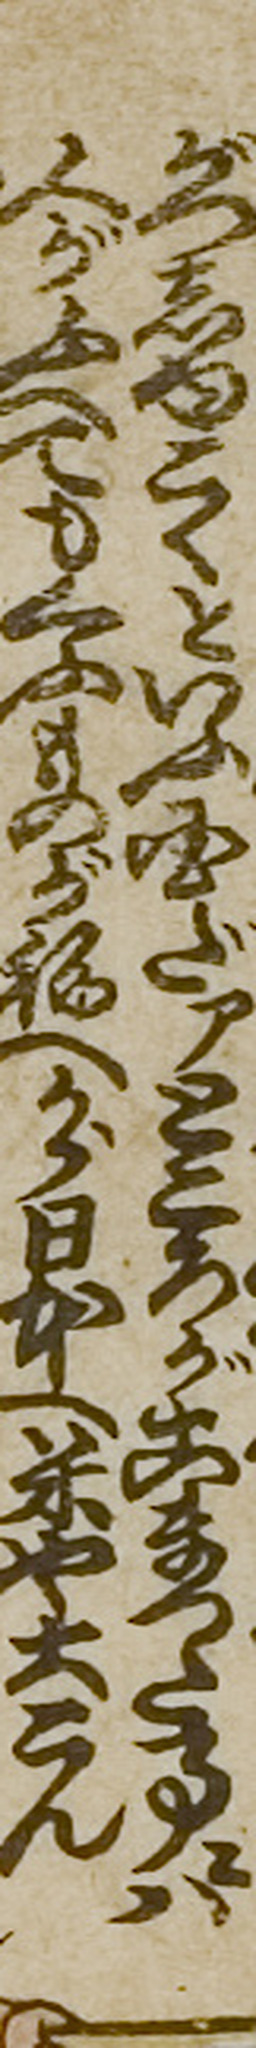人がふへてもくふものがねへから日本へ米や大こん
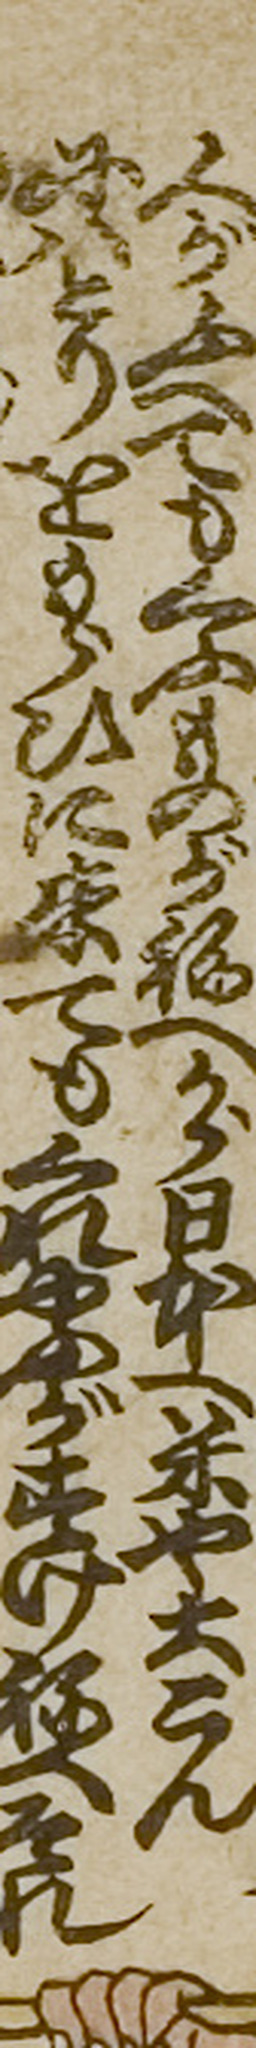にハとりをもらひに来てもくれやふがすけねへそれ
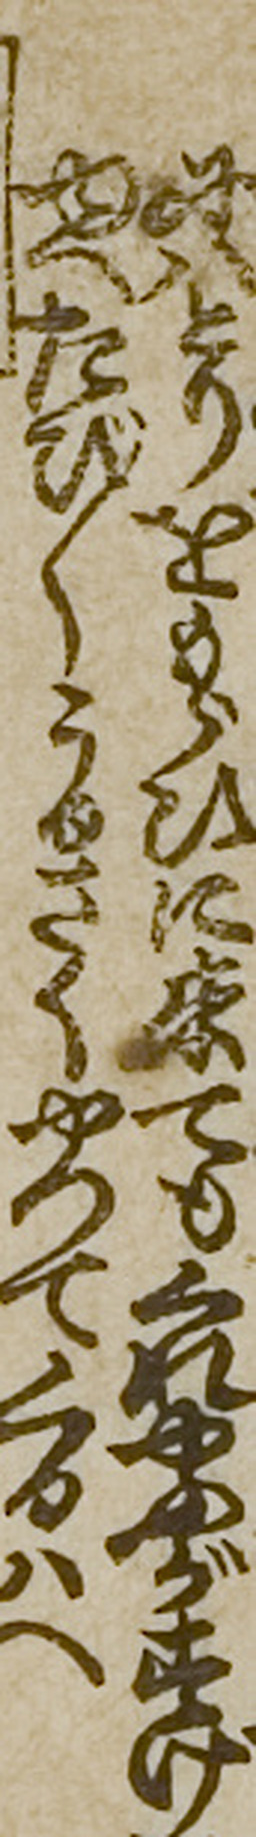ゆへたびたびうるさくやつてくるハへ
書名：安政二年十月二日夜大地震鯰問答
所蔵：東京大学総合図書館 General Library in the University of Tokyo, JAPAN
